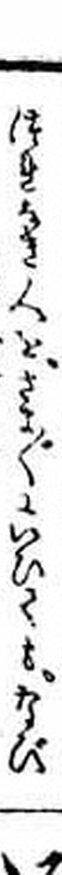つれなき人をさま〴〵にいひてもなび源俊頼
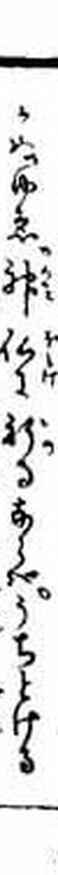かぬゆゑ神仏に祈るならばうちとける
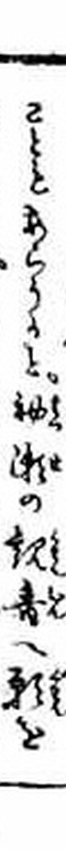こともあらうと初瀬の観音へ願を
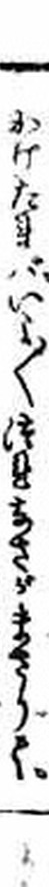かけたればいよ〳〵つれなさがまさりて
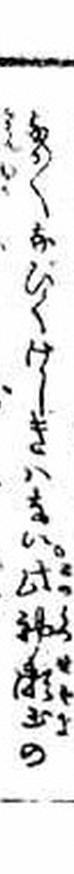なか〳〵なびくけしきはないこの初瀬山の
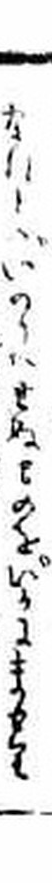なれとはいのりはせぬものをいかにまもり朝
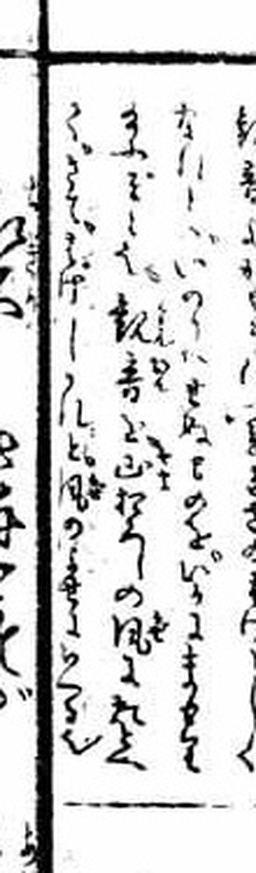給ふぞと也観音を山おろしの風にたとへ
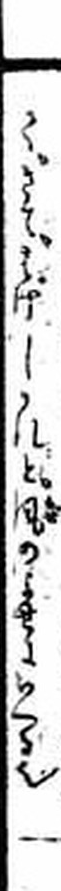てさてはげしかれと風のよせていへる也信
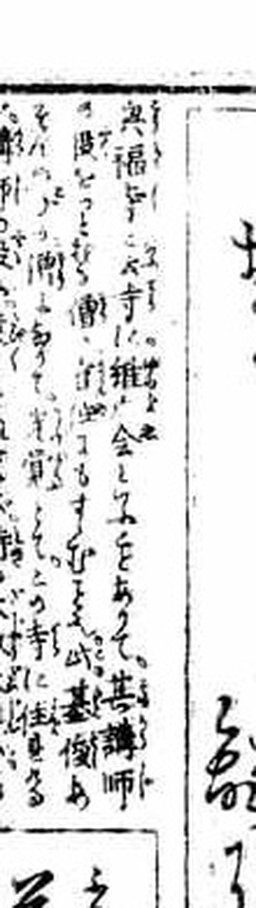興福寺と云寺に維摩会といふことありて其講師
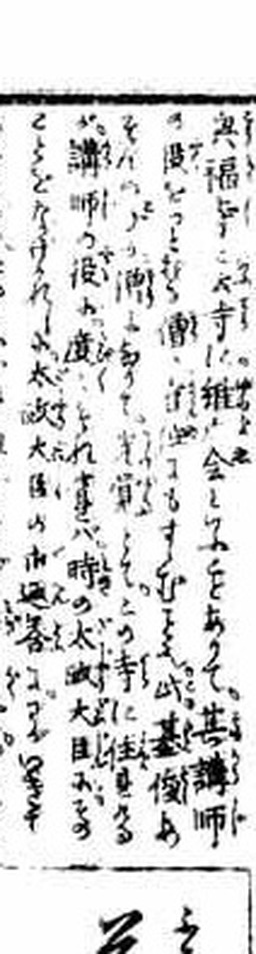そんの子が僧になりて光覚とてこの寺に住れける
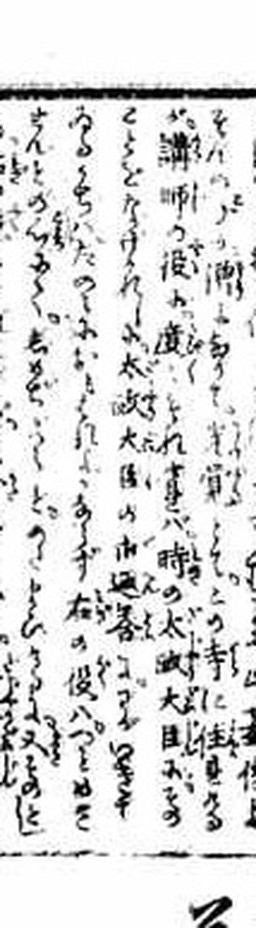ことをなげかれしに太政大臣の御返答にわがいきて
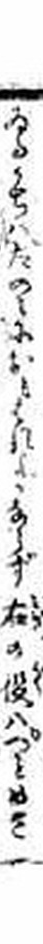いるうちにはたのみにおもはれよかならず右の役はつとめさ
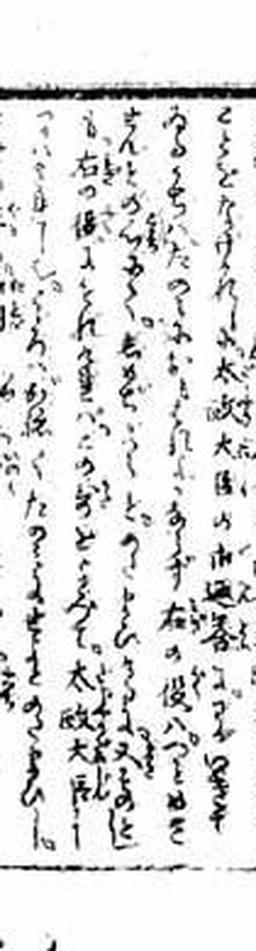せんとの心にてしめぢがはらとのたまひけるにまたそのとし
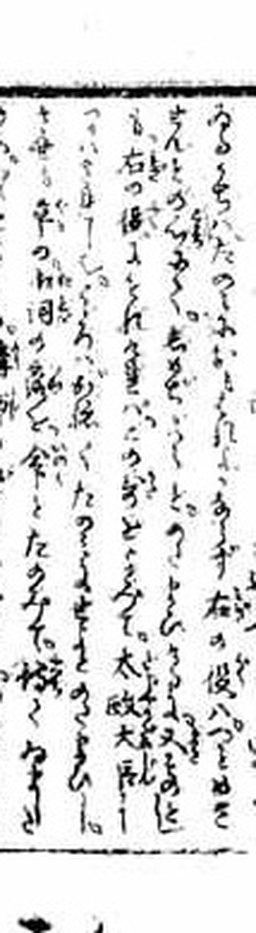も右の役にもれけばこの哥をよみて太政大臣に
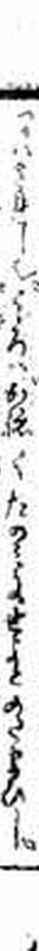つかはされし也こゝろはかね〳〵たのみにせよとのたまひし
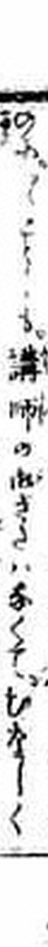のに又ことしも講師の御さたはなくてむなしく
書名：小倉百人一首
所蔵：東京学芸大学教育コンテンツアーカイブ
